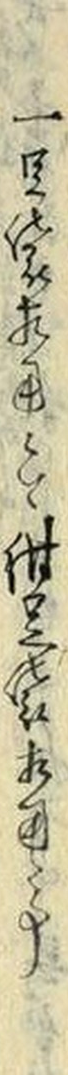一足袋相用候ハゝ紺足袋相用候事
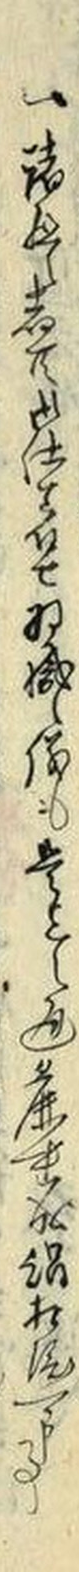一諸組之者共御仕着せ羽織之儀も是迄之通廉末成絹相渡可申事
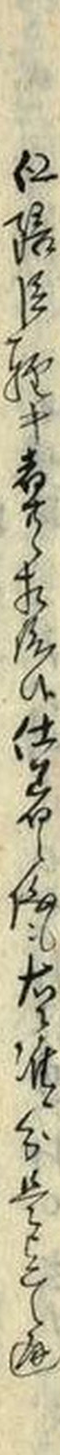但陪臣軽キ者共へ相渡候仕着之儀も右ニ准候分是迄之通
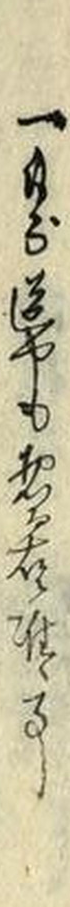一自分道中も惣而右ニ准候事
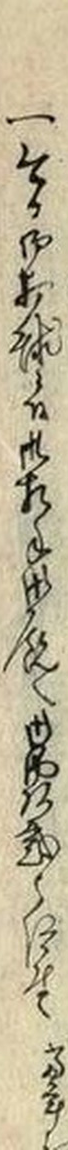一今日御打毬ニ付御相手御厩へ御酒頂戴被仰付候当年初而
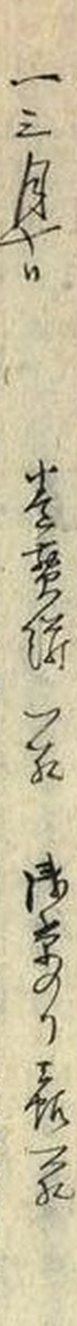一三月十日巻煎餅一箱浅草のり巻鮓一箱
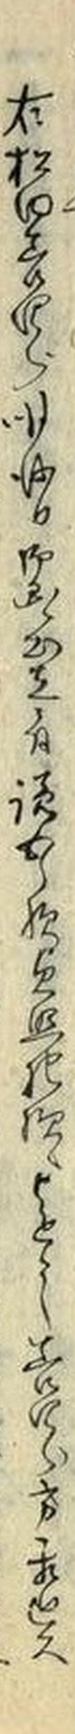右松田善四郎明後日御国へ出立ニ付謙五郎様貞照院様へ被進之善四郎方へ相廻ス
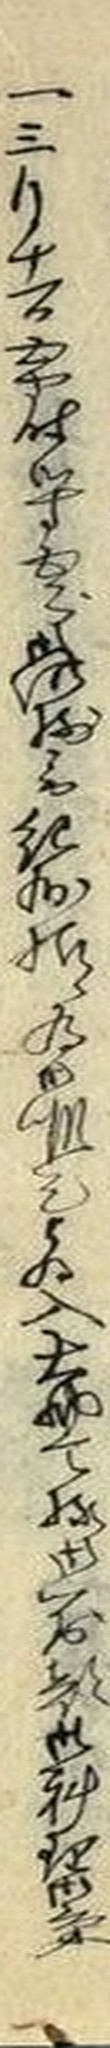一三月十一日五半時御供揃ニ而紀州様へ御暇乞被為入大納言様御対顔御料理御菓
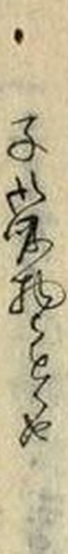子御吸物被進候由
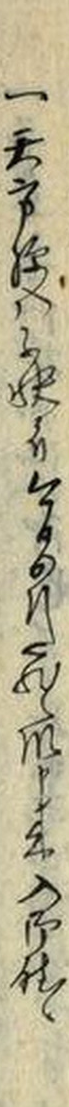一天方孫八不快ニ付今日ゟ引籠候段申来入御聴候

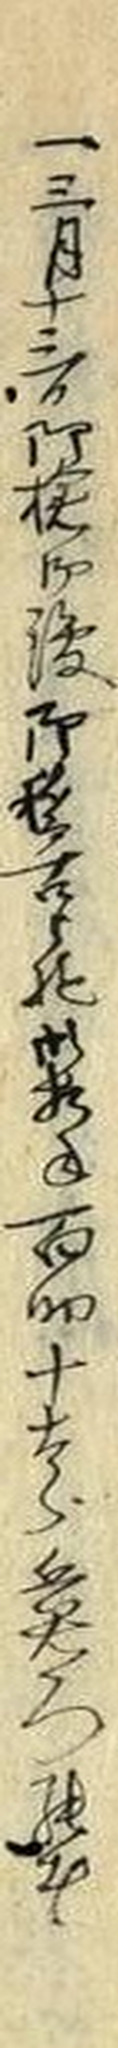一三月十三日御槍御護御稽古被遊御相手百助十太郎兵右衛門罷出候
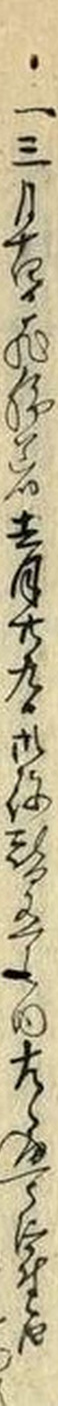一三月十四日飛脚着去月廿九日御役替有之由左通被仰付候由
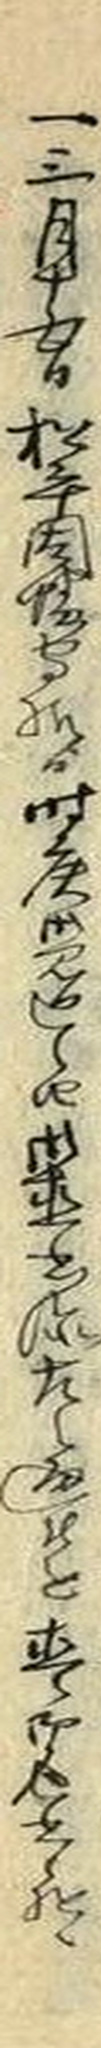一三月十五日松平因幡守様ゟ時候御見廻候由御直書添左之通被進直々御返書被遊候
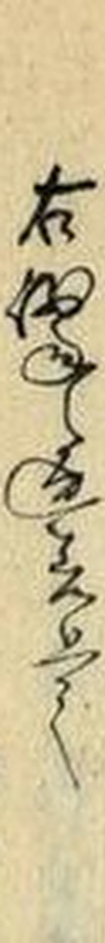右例年之通差上之
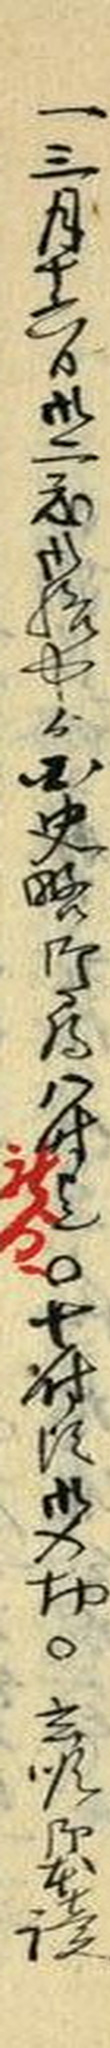一三月十六日御二度御膳中ゟ国史略御尋八時迄新右衛門○七時頃御〆切○玄順御本読
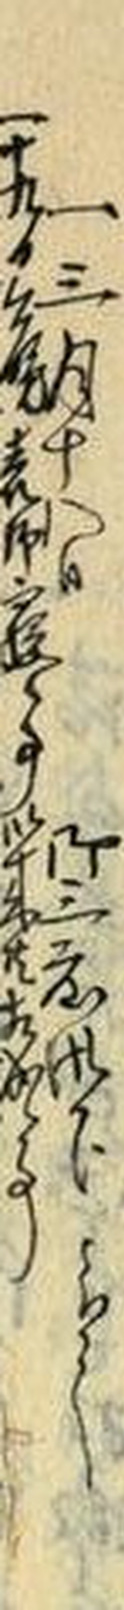一十九日今晩表御寝候事以来共相成候事
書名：少傅日録抄（斉承付側向頭取日記、在府）
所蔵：福井県文書館 Fukui Prefectural Archives
